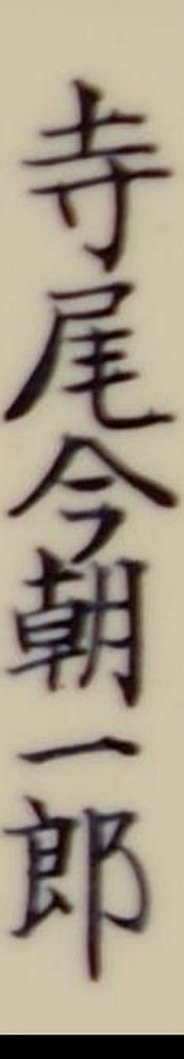寺尾今朝一郎
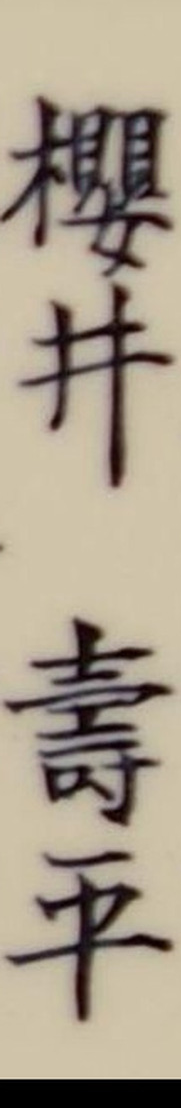桜井壽平
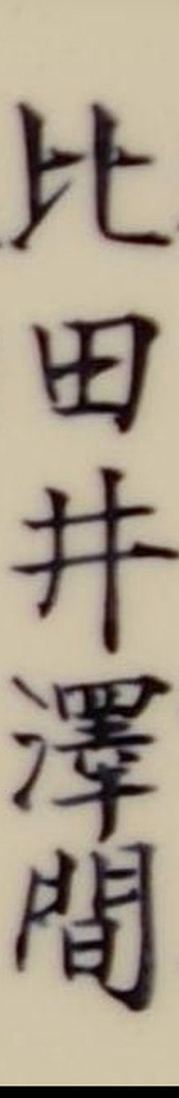比田井澤間
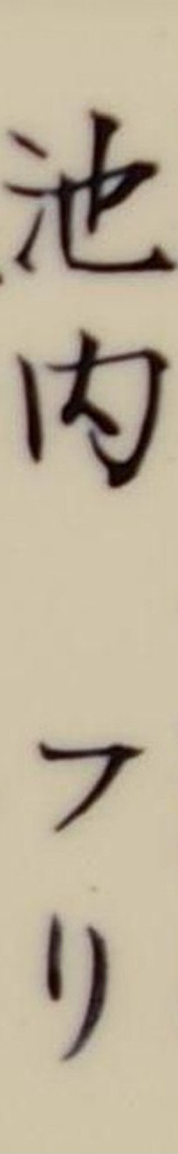池内フリ
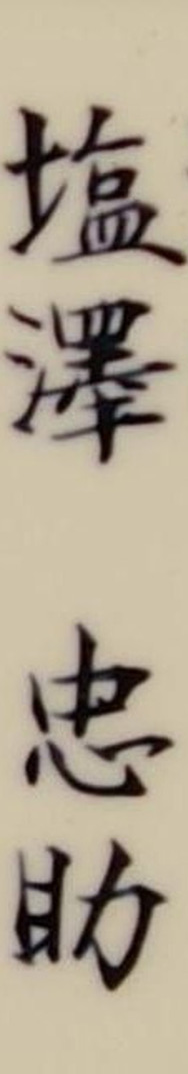塩澤忠助
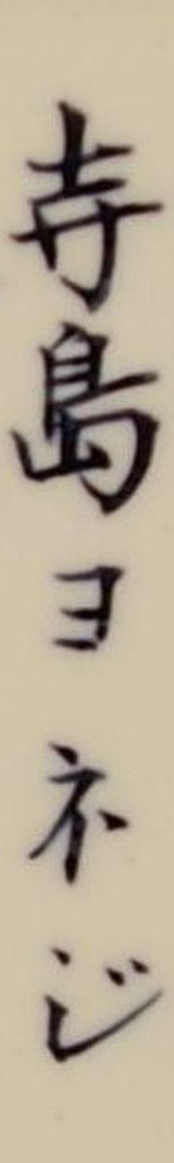寺島ヨネジ
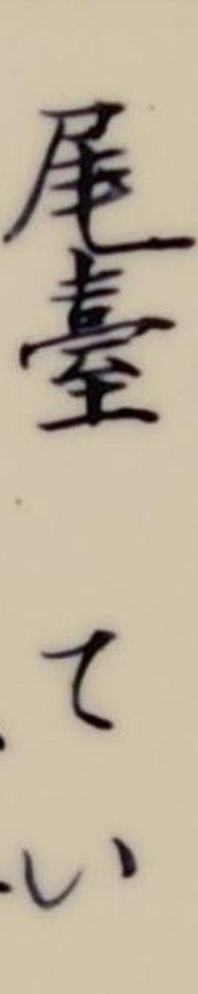尾台てい
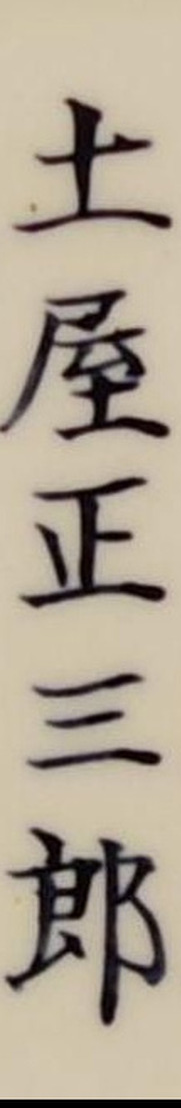土屋正三郎
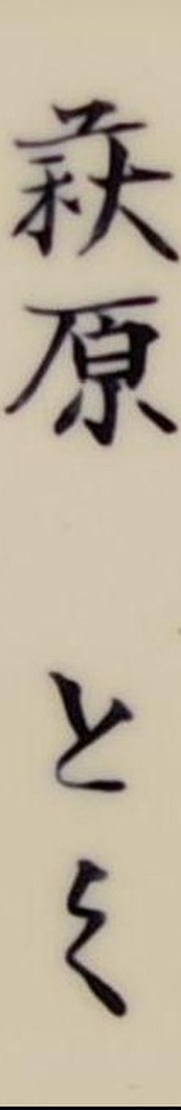萩原とく
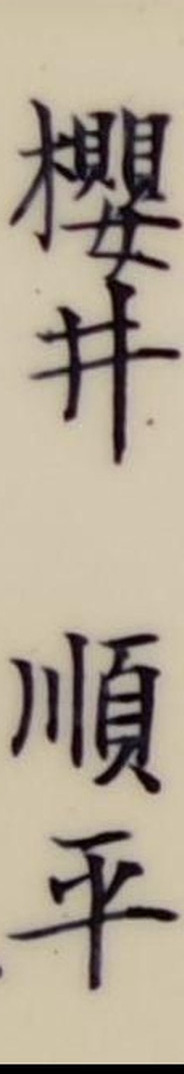桜井順平
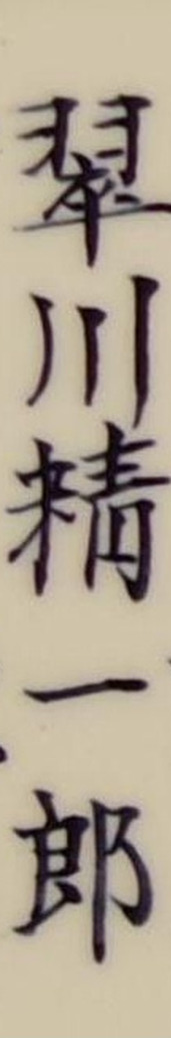翠川精一郎
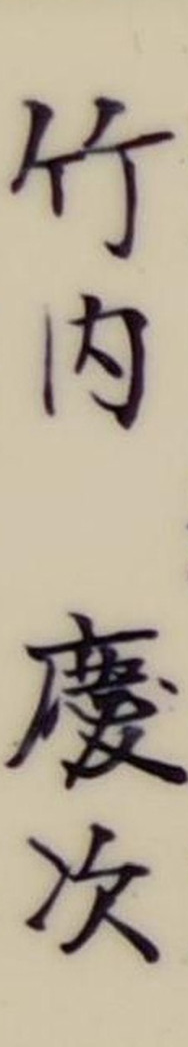竹内慶次
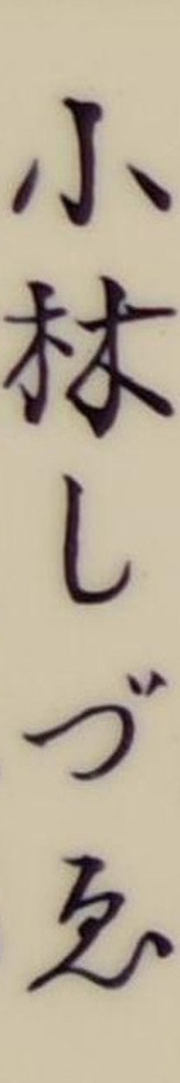小林しづゑ
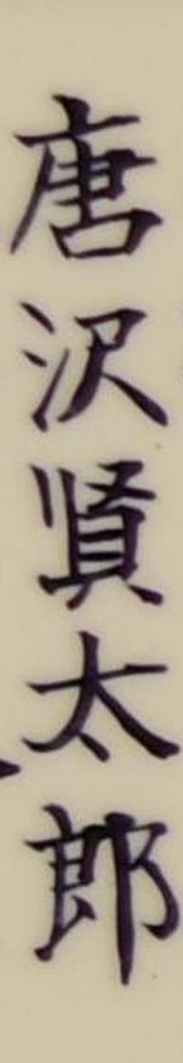唐沢賢太郎
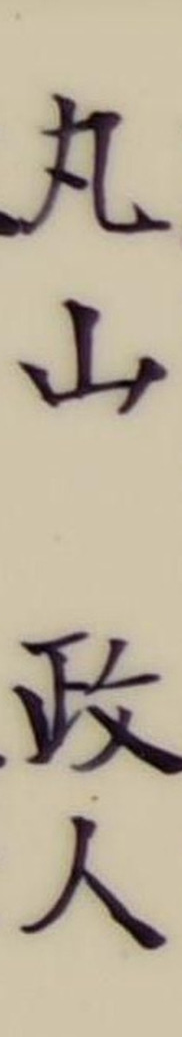丸山政人
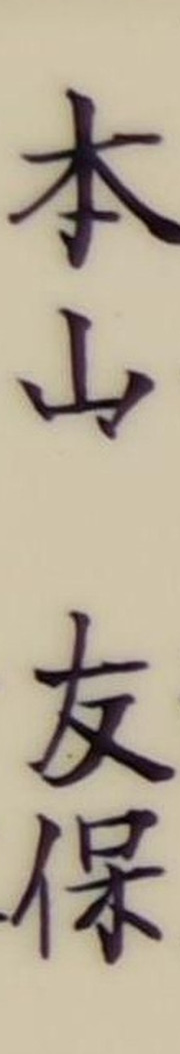本山友保
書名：E~L
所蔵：高野山金剛峯寺
